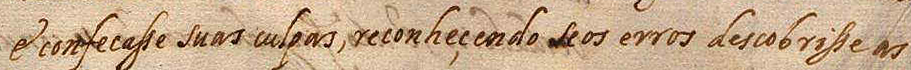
e confeçasse suas culpas, reconhecendo se os erros descobrisse as
